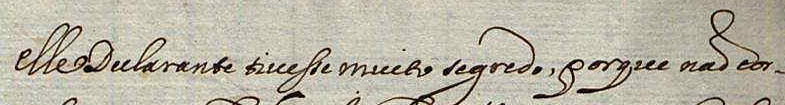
elle Declarante tiuesse muito segredo, porque naõ cor
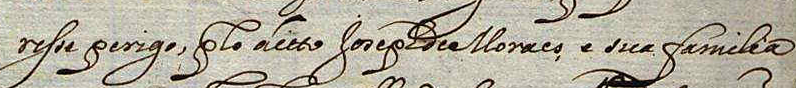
resse perigo, p̄lo ditto Joseph de Moraes, e sua familia
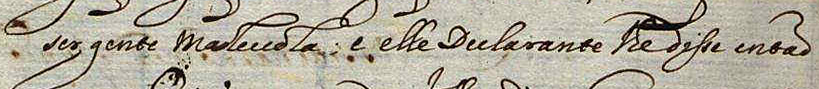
ser gente maleuola; e elle Declarante lhe disse então
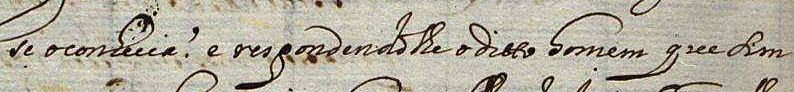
se o conhecia? e respondendolhe o ditto homem que sim
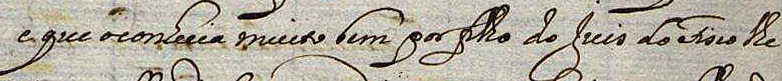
e que o conhecia muito bem por filho do Juis do Fisco lhe
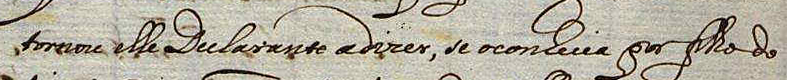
tornou elle Declarante a dizer, se o conhecia por filho do
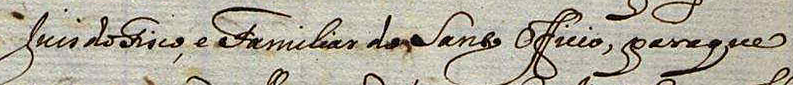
Juis do Fisco, e Familiar do Santo Officio, para que
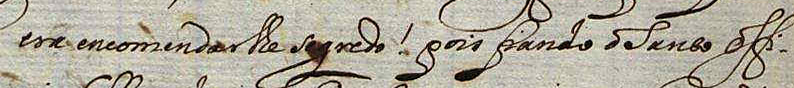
era encomendar lhe segredo! pois fiando o Santo offi
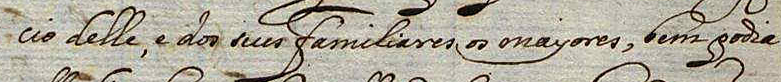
cio delle, e dos seus familiares os mayores, bem podia
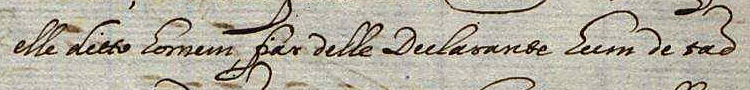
elle ditto homem fiar delle Declarante hum de taõ
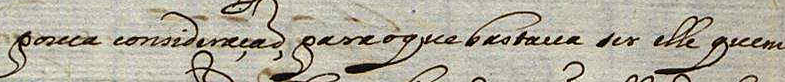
pouca consideraçaõ, para o que bastaua ser elle quem
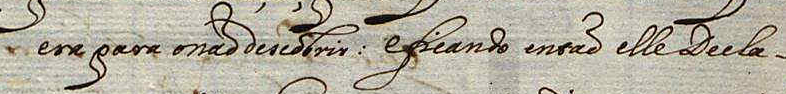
era para o naõ descobrir: e ficando entaõ elle Decla
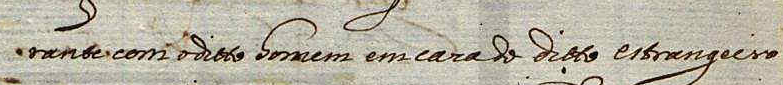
rante com o ditto homem em caza do ditto estrangeiro
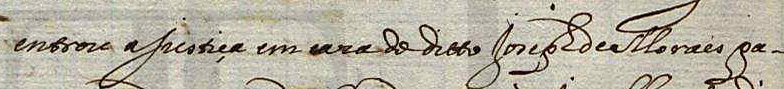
entrou a Justiça em caza do ditto Joseph de Moraes pa
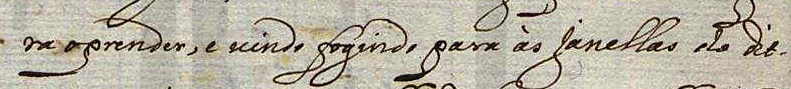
ra o prender, e uindo fogindo para as janellas do dit
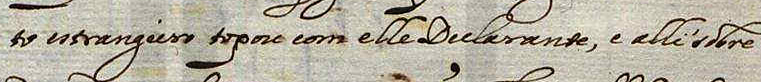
to estrangeiro topou com elle Declarante, e alli sobre
